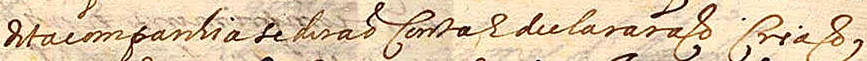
dita companhia se deraõ Conta E declararaõ Criaõ
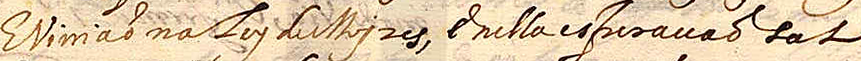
E Viuiaõ na Ley de Mojzes, & nella esperauaõ sal
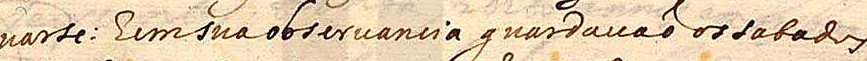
uarse: E em sua obseruancia guardauaõ os sabados
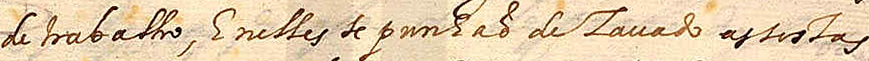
de trabalho, e nelles se punhaõ de Lauado as sestas
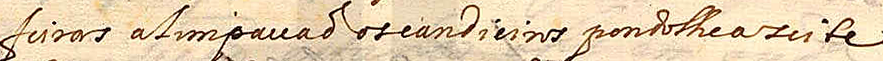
feiras aLimpauaõ os candieiros pondolhe azeite
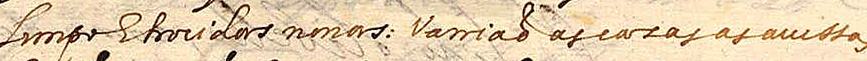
Limpo E trocidas nouas: Varriaõ as cazas as auessas
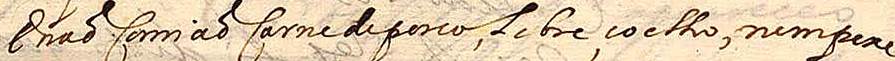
& naõ Comiaõ Carne de porco, Lebre, coelho, nem pexe
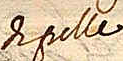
de pelle
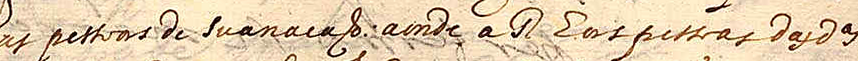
as pessoas de sua nacaõ: aonde a R E as pessoas das das
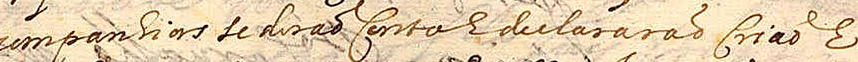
companhias se deraõ Conta E declararaõ Criaõ E
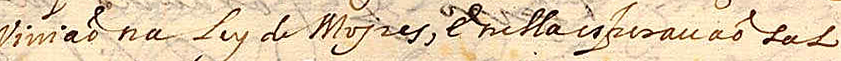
Viuiaõ na Ley de Mojzes, & nella esperauaõ sal
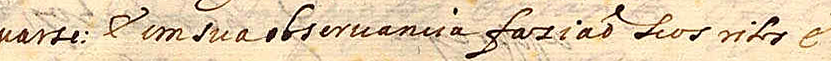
uarse: & em sua obseruancia faziaõ seos ritos &
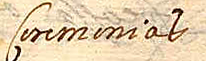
Ceremonias
